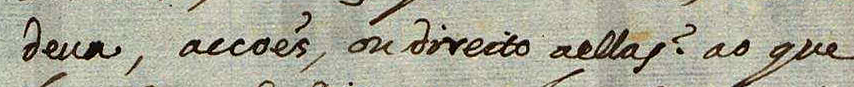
deua, acçoẽs, ou direito a ellas? ao que
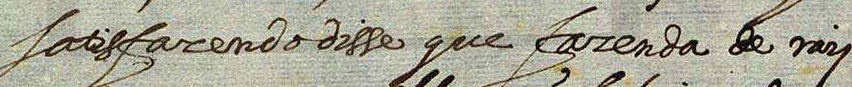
satisfazendo disse que fazenda de raiz
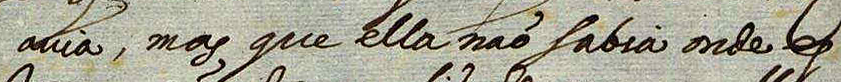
auia, mas que ella naõ sabia onde es
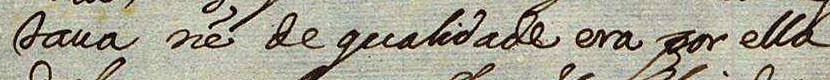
taua nē de qualidade era por ella
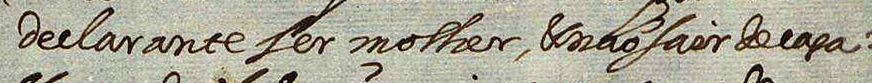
declarante ser molher, & naõ sair de casa
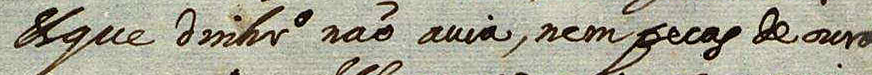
& que dinhro naõ auia, nem peças de ouro
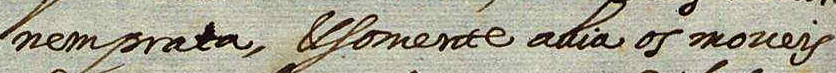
nem prata, & somente auia os moueis
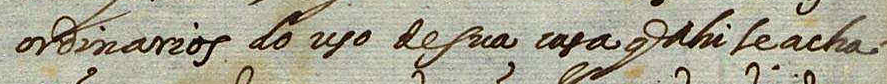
ordinarios do uso de sua casa q̄ ahi se acha
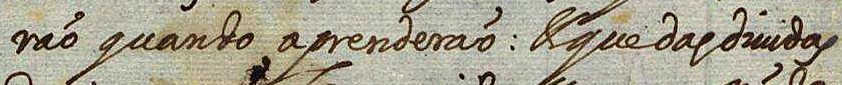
raõ quando aprenderaõ: & que das diuidas
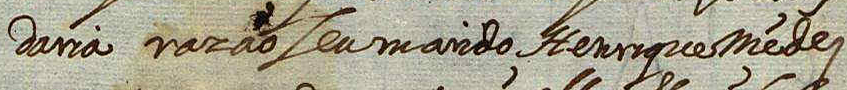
daria razaõ seu marido Henrique Mēdez
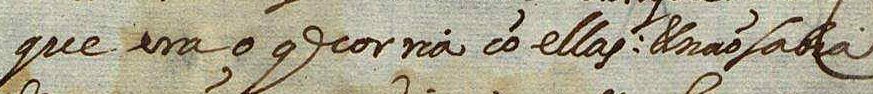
que era o q̄ corria cō ellas: & naõ sabha
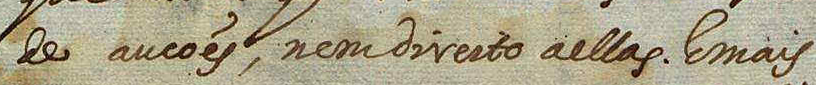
de auços, nem direito a ellas. E mais
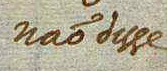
naõ disse
